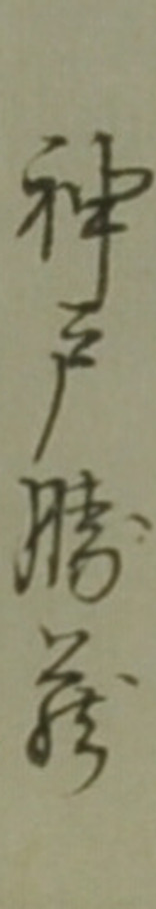神戸勝蔵
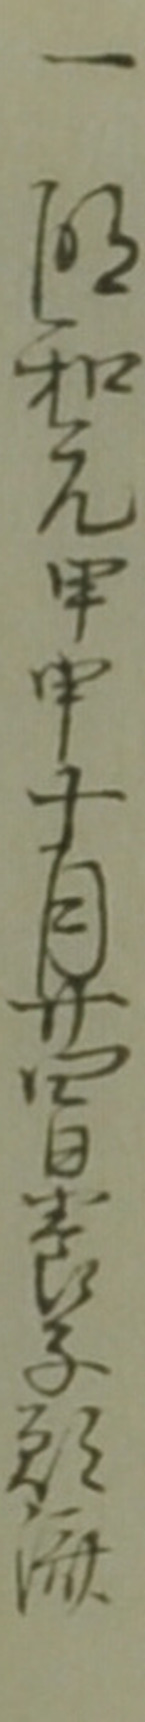一明和元甲申十月廿四日養子願済
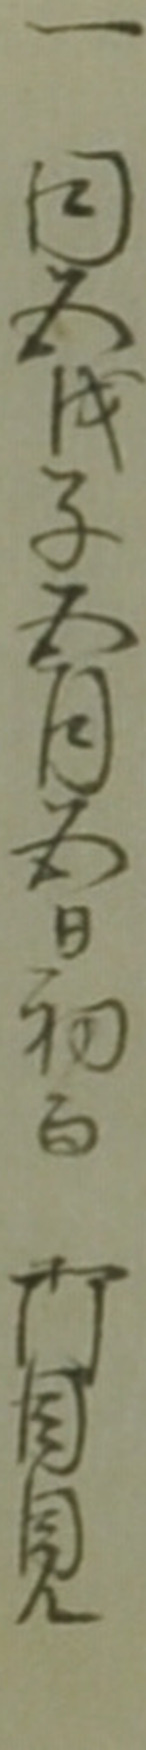一同五戊子五月五日初而お目見
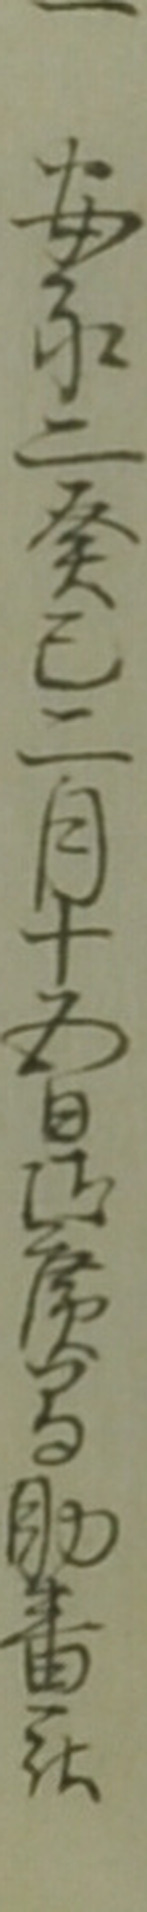一安永二癸巳二月十五日御広間助番被
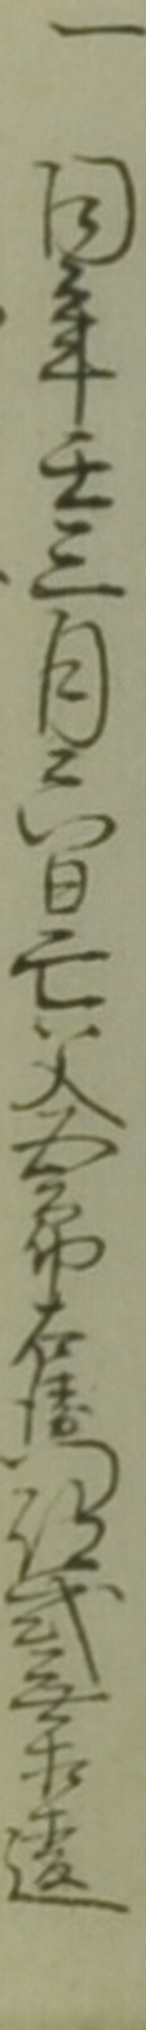一同年壬三月六日亡父五郎右衛門跡式無相違
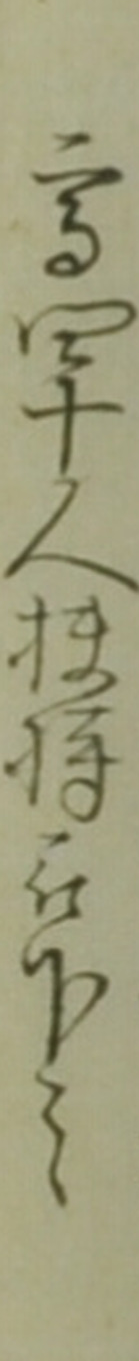高四十人扶持被下之
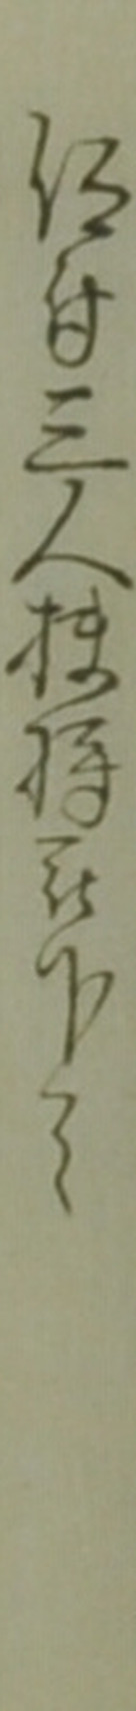仰付三人扶持被下之

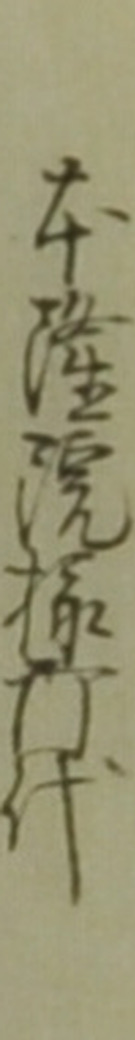本隆院様御代
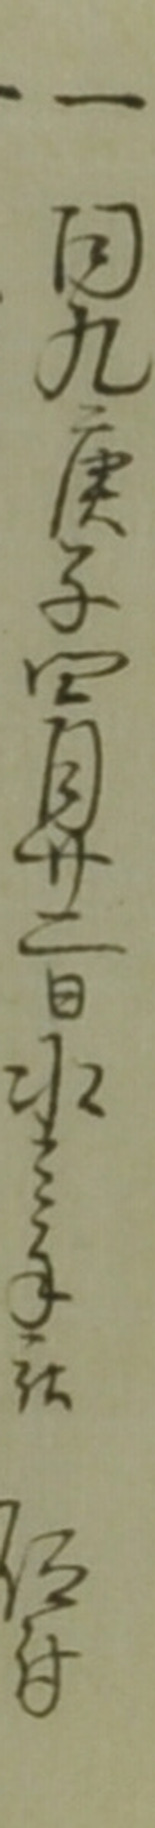一同九庚子四月廿二日水之手被仰付
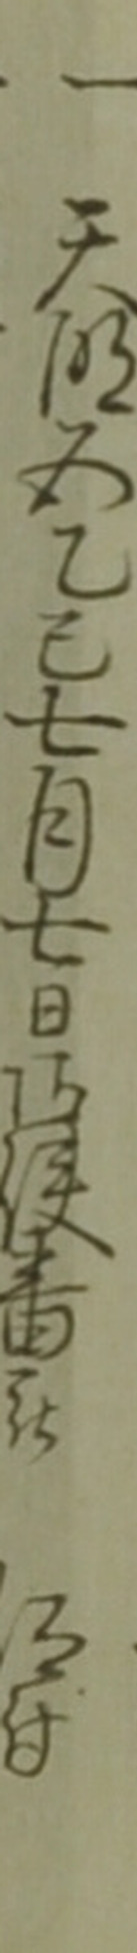一天明五乙巳七月七日御使番被仰付
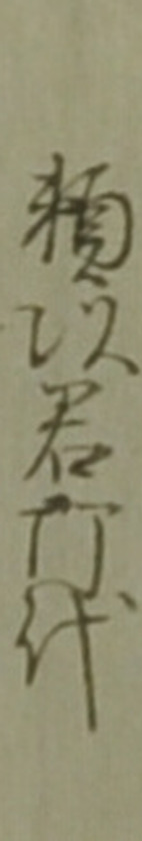頼以君御代
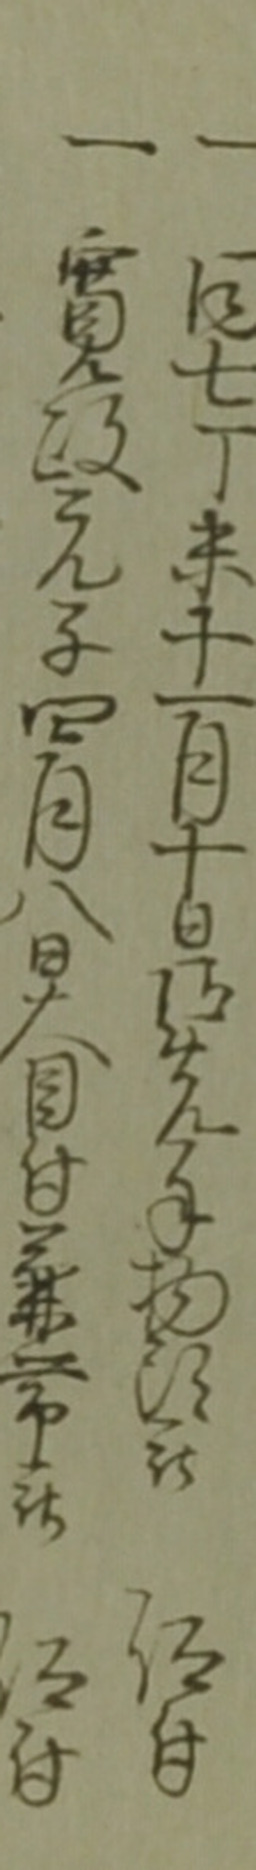一寛政元子四月八日大目付兼帯被仰付
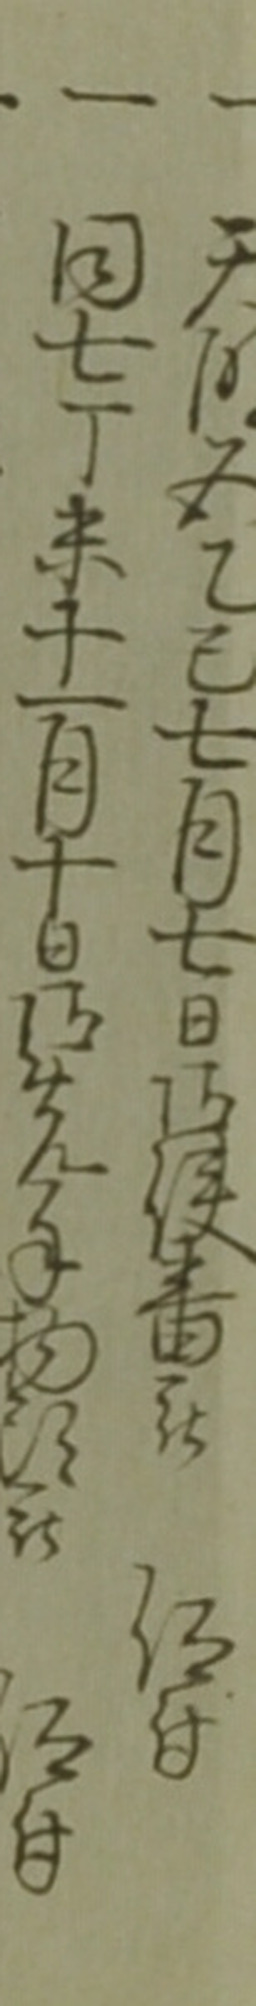一同七丁未十一月十日御先手物頭被仰付
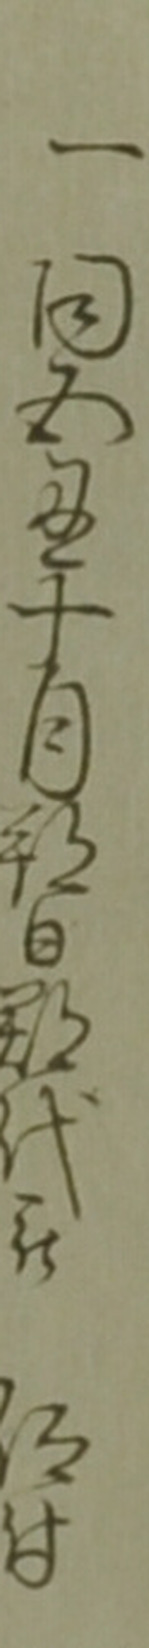一同五丑十月朔日郡代被仰付
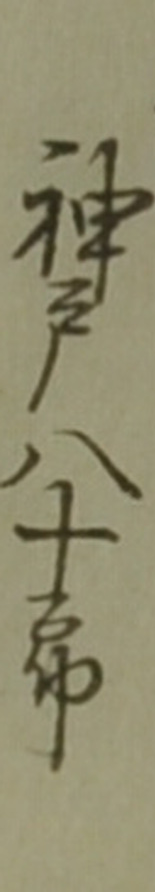神戸八十郎
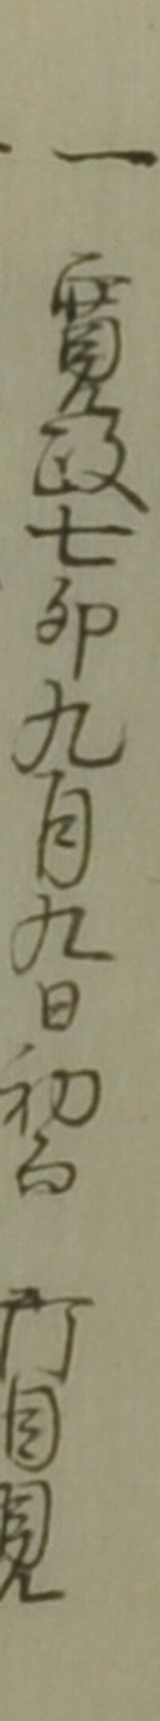一寛政七卯九月九日初而御目見
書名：給人諸士勤仕録（三）
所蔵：伊那市立高遠町図書館・合同会社AMANE
